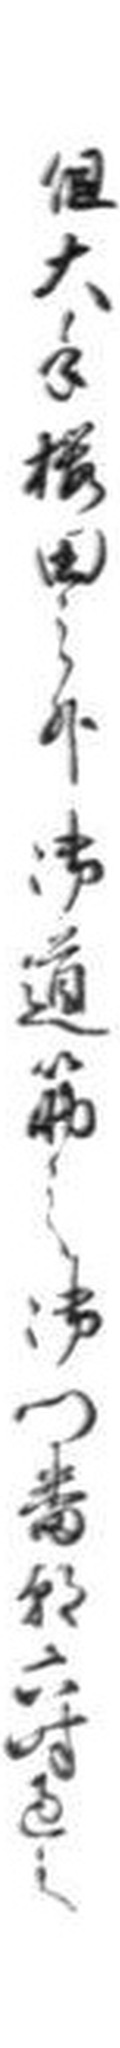但大手桜田之外御道筋之御門番朝六時過之
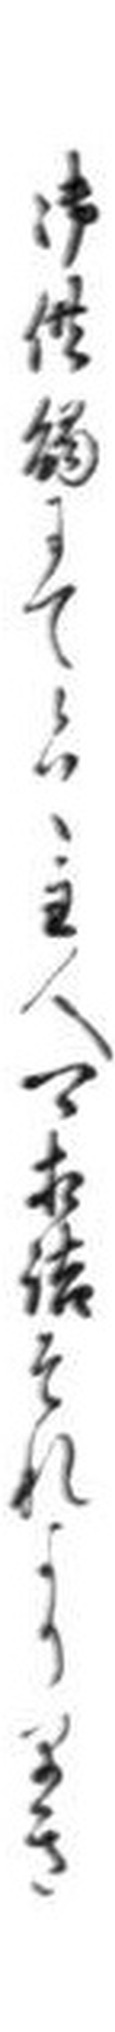御供触にて候ハヽ主人可相詰それより早き
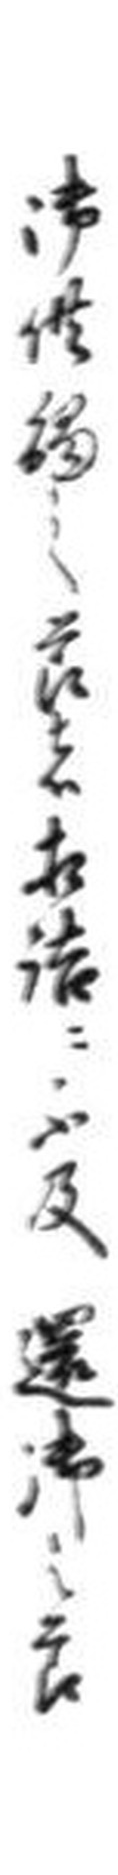御供触之節者相詰ニ不及還御之節
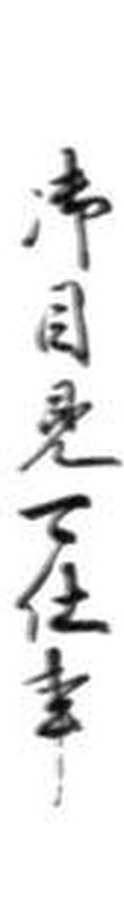御目見可仕事
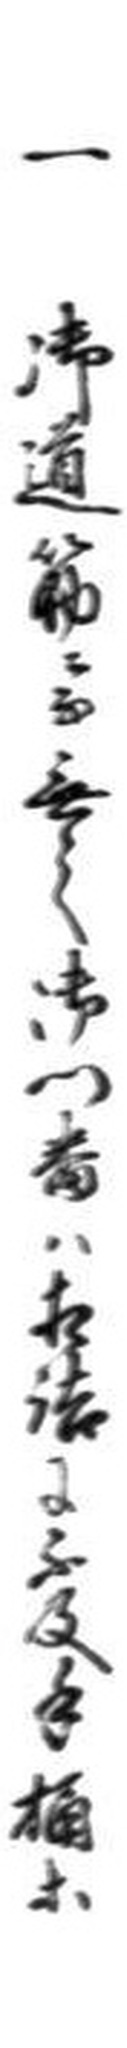一御道筋ニ而無之御門番ハ相詰に不及手桶等
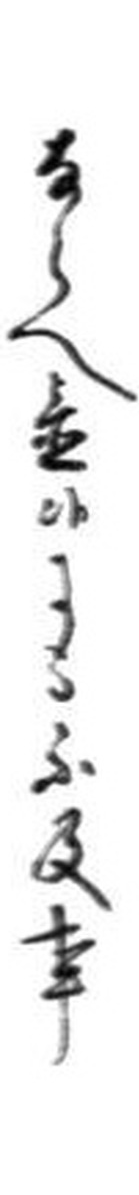ならへ置候にも不及事
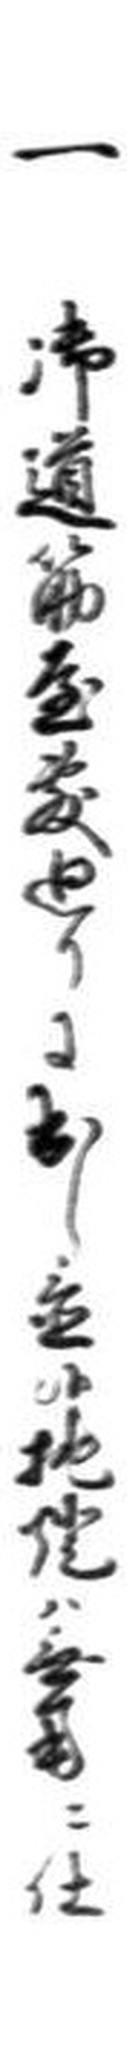一御道筋屋敷廻りに出し置候挑燈ハ無用ニ仕
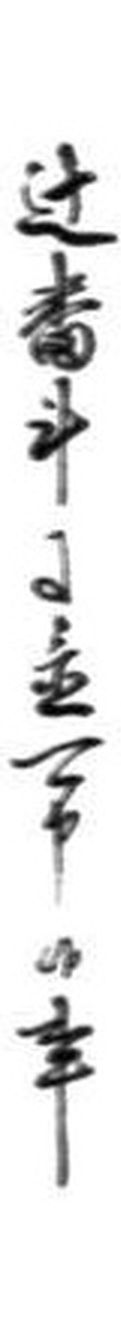辻番斗に置可申候事
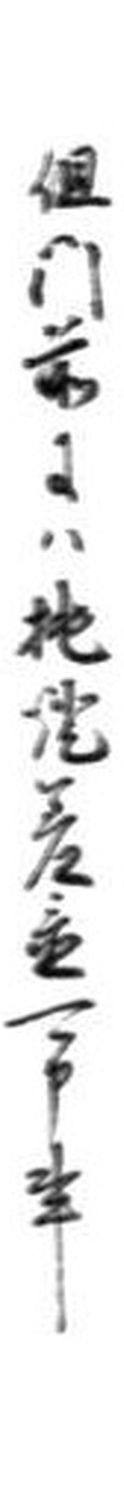但門前にハ挑燈差置可申事
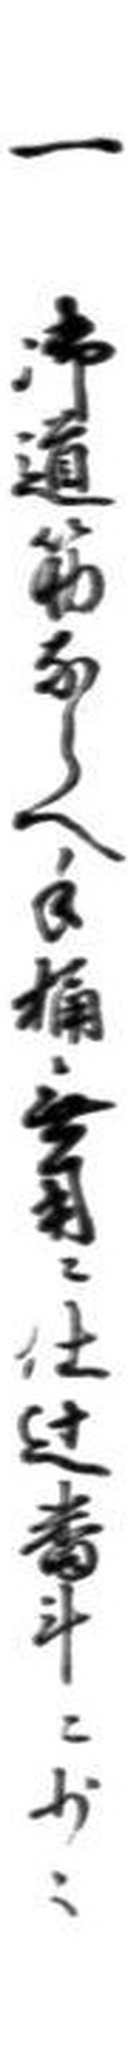一御道筋ならへ手桶無用ニ仕辻番斗ニ少々
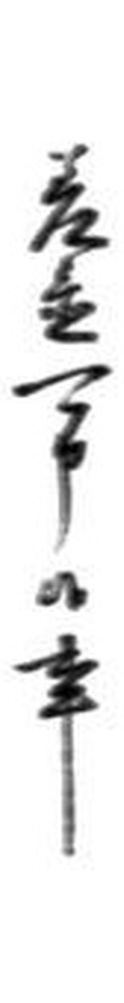差置可申候事

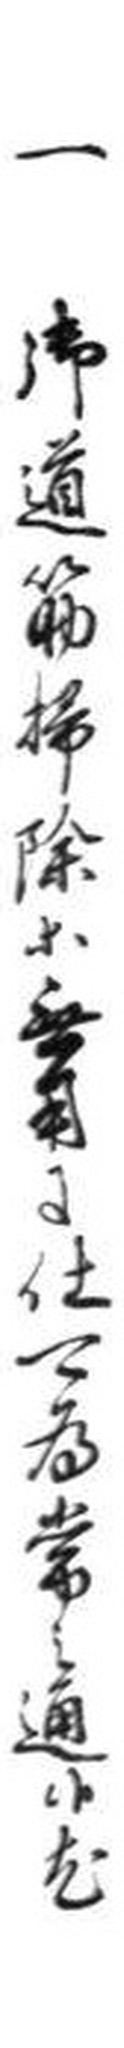一御道筋掃除等無用に仕可為常之通候尤
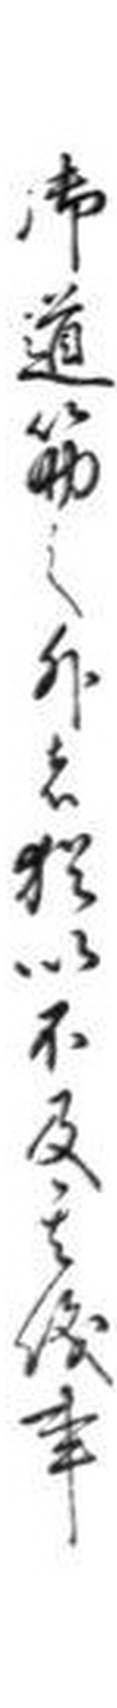御道筋之外者猶以不及其儀事
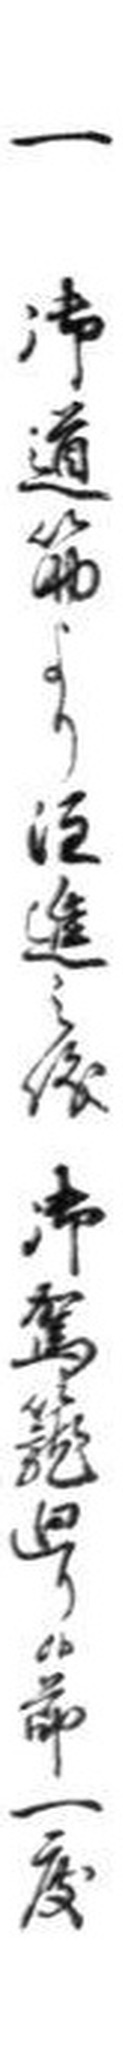一御道筋より注進之儀御駕籠廻り候節一度
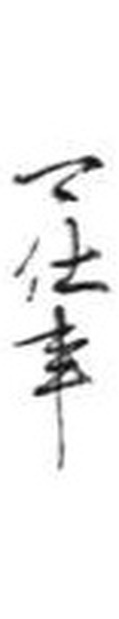可仕事
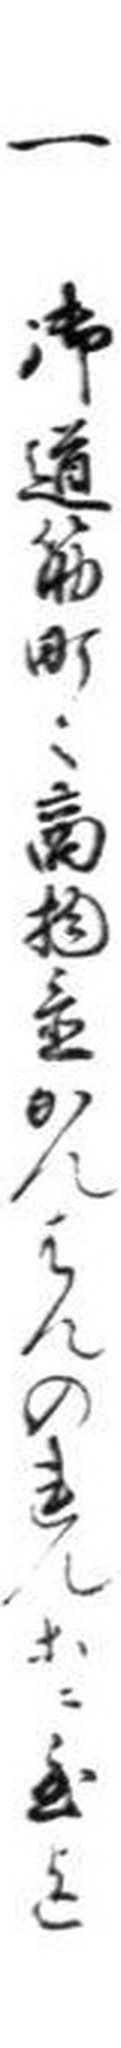一御道筋町々商物置かんはんのれん等ニ至迄
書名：家譜 三十二 吉邦公 従享保二年到享保三年
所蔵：福井県文書館 Fukui Prefectural Archives
